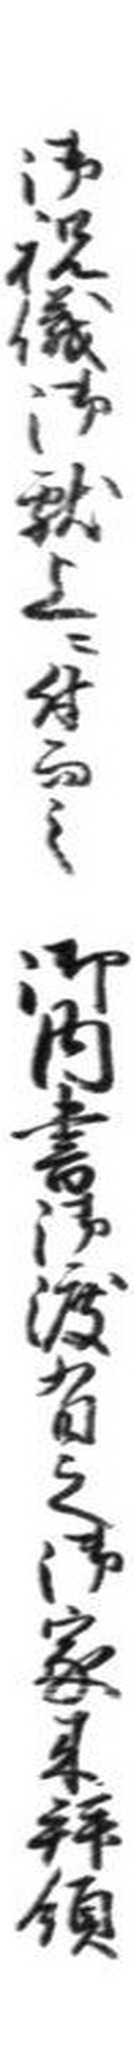御祝儀御献上ニ付而之御内書御渡有之御家来拝領
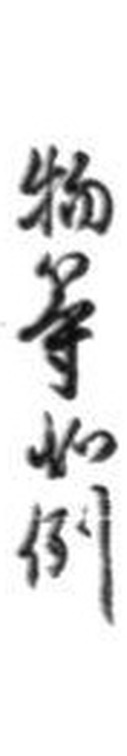物等如例
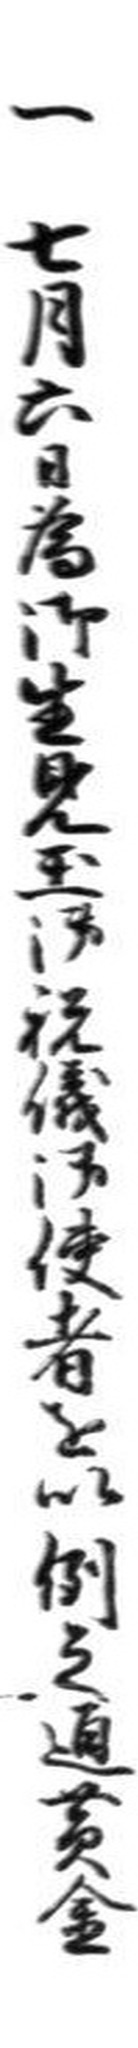一七月六日為御生見玉御祝儀御使者を以例之通黄金
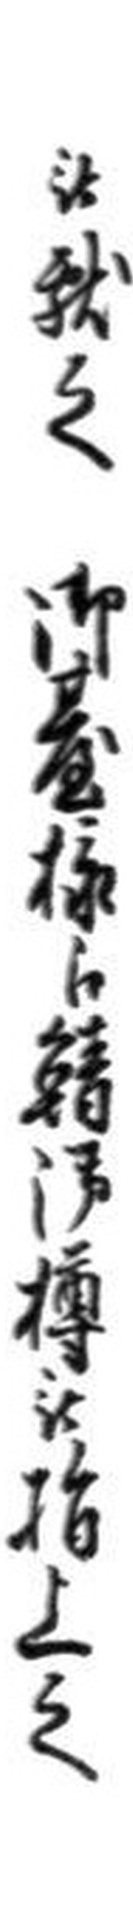被献之御台様江鯖御樽被指上之
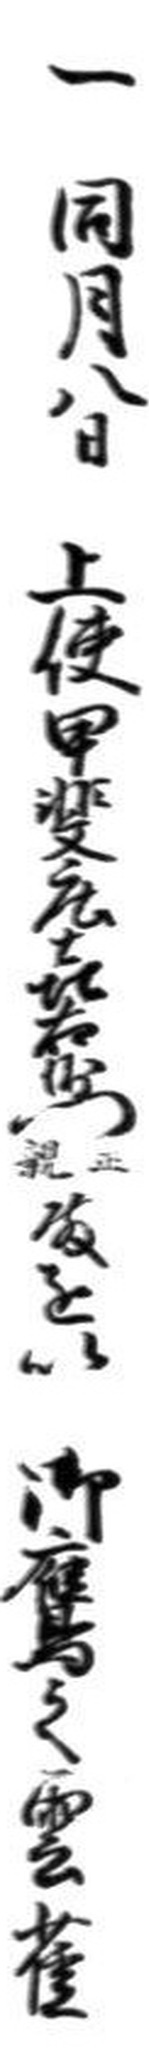一同月八日上使甲斐庄喜右衛門正親殿を以御鷹之雲雀
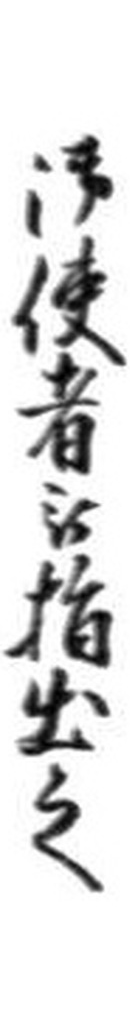御使者被指出之
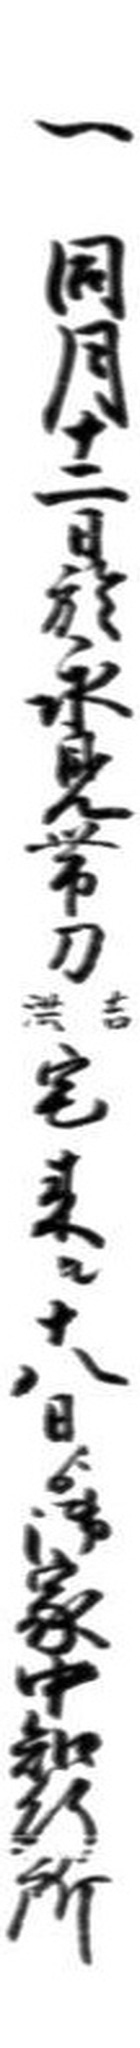一同月十二日於永見帯刀吉洪宅来ル十八日ゟ御家中知行所
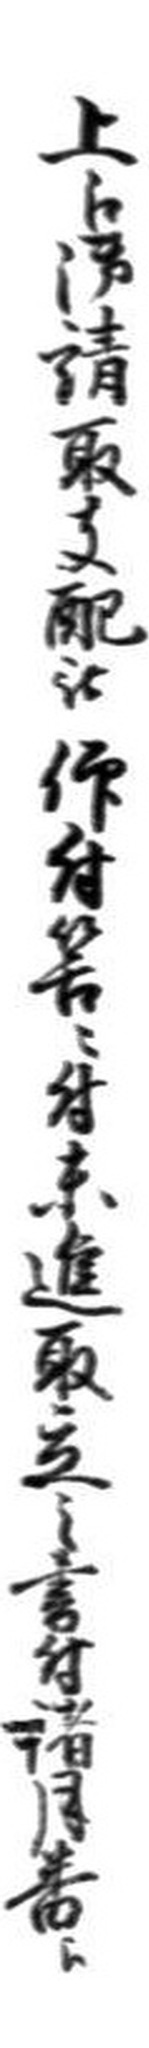上江御請取支配被仰付筈ニ付未進取立之書付諸月番江
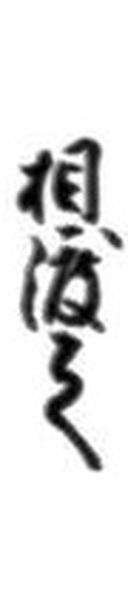相渡之
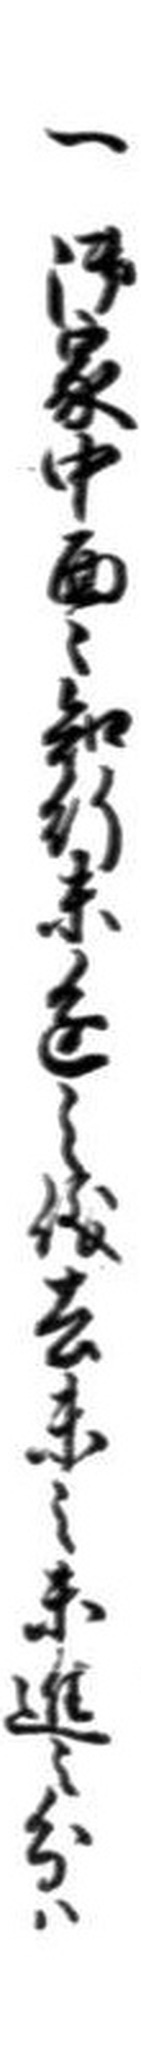一御家中面々知行未進之儀去未之未進之分ハ
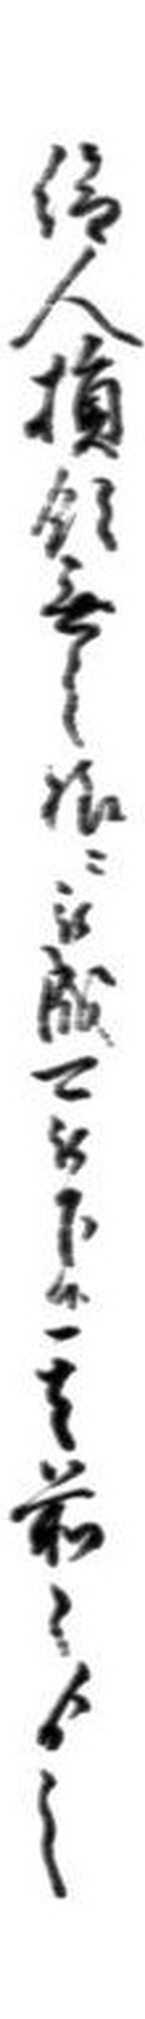給人損領無之様ニ被成可被下候其前々ゟ之

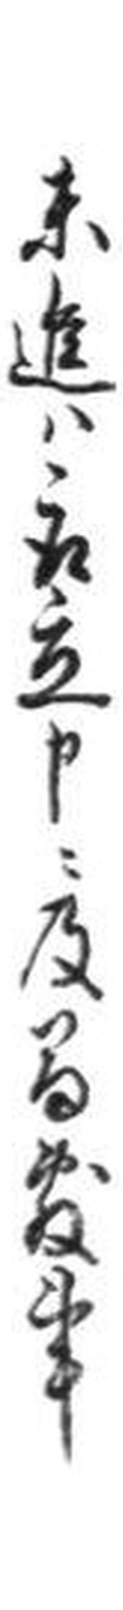未進ハ取立申ニ及間敷事
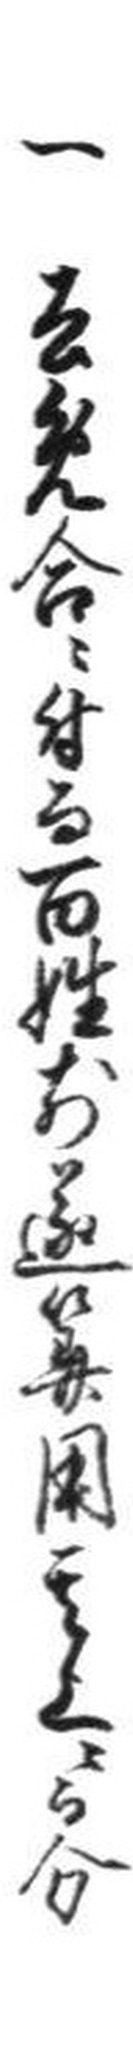一去免合ニ付而百姓前遂算用其上ニ而分
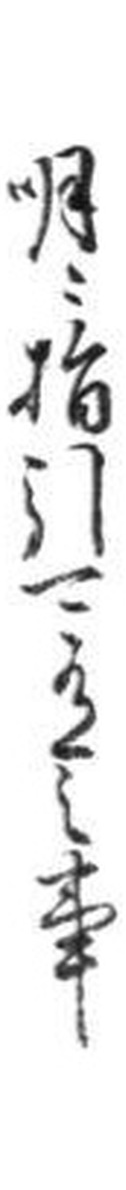明ニ指引可有之事
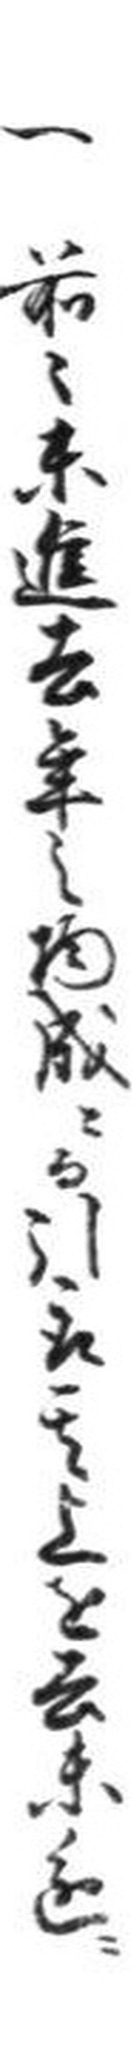一前々未進去年之物成ニ而引取其上を去未進ニ
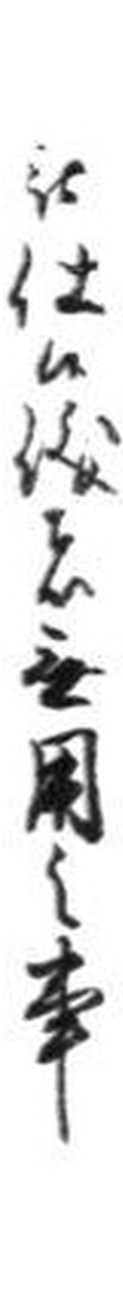被仕候儀者無用之事
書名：家譜 七 光通公 従寛文四年到同九年
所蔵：福井県文書館 Fukui Prefectural Archives
